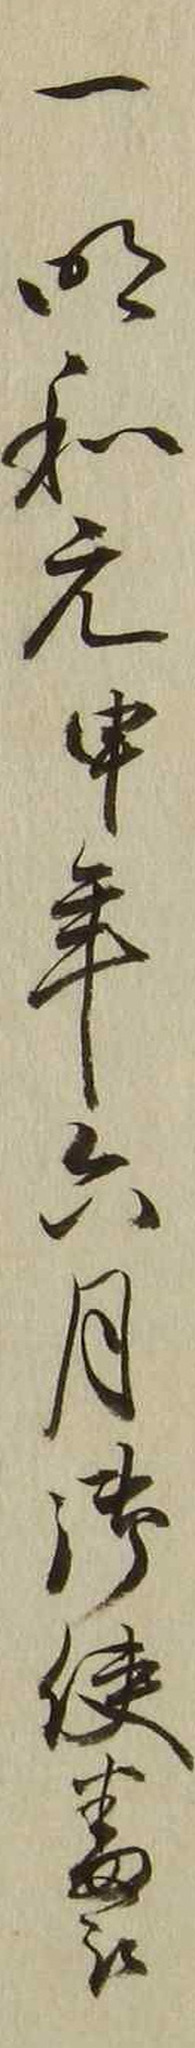一明和元申年六月御使番被
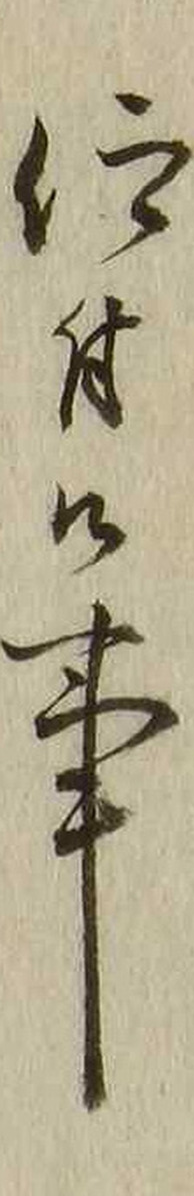仰付候事
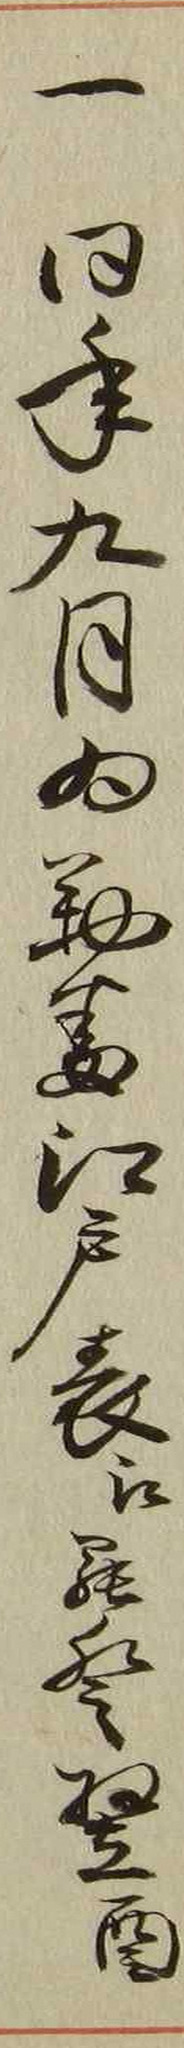一同年九月為勤番江戸表江罷登翌酉
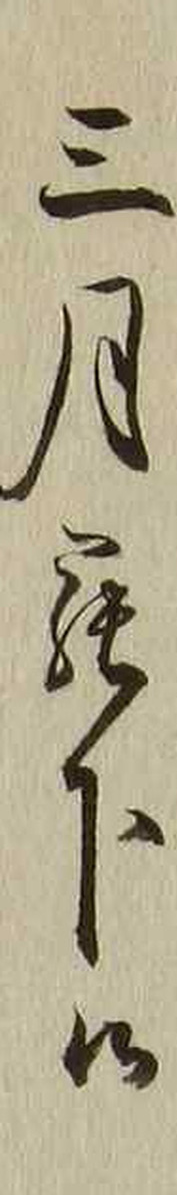三月罷下候
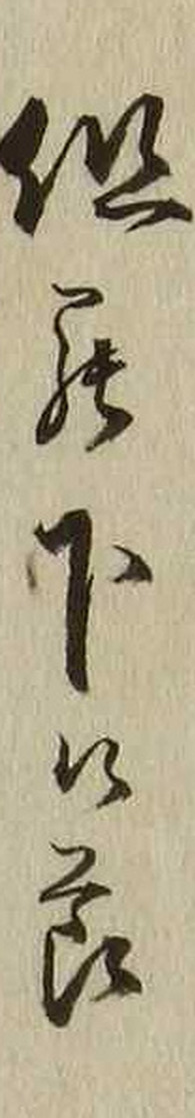但罷下候節
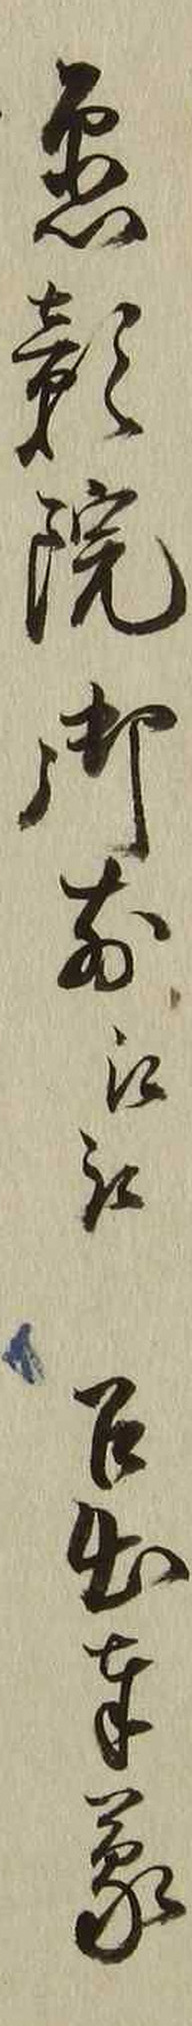愿彰院御前江被召出奉蒙
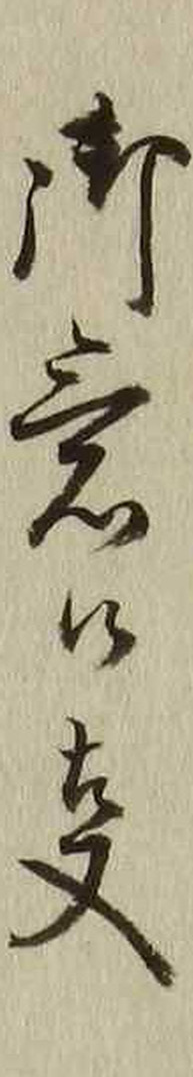御意候事
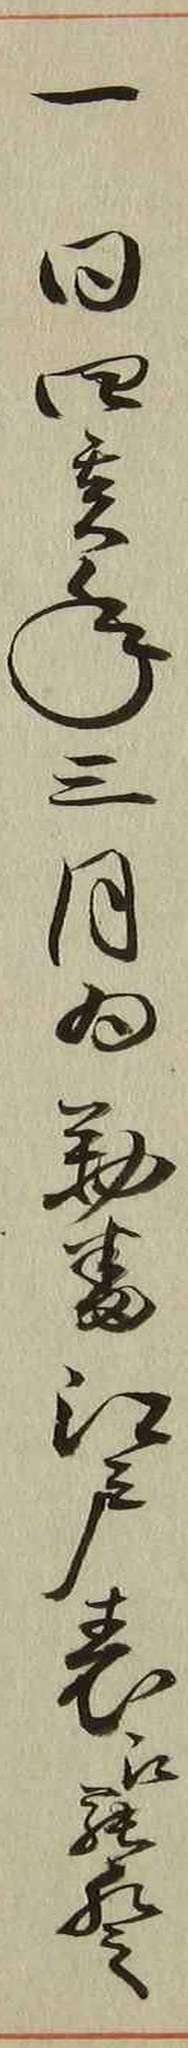一同四亥年三月為勤番江戸表江罷登
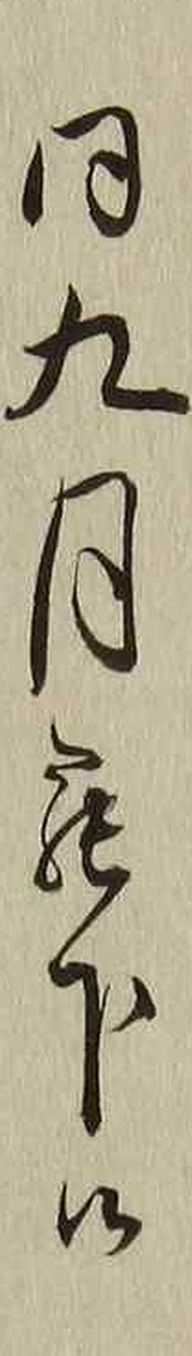同九月罷下候
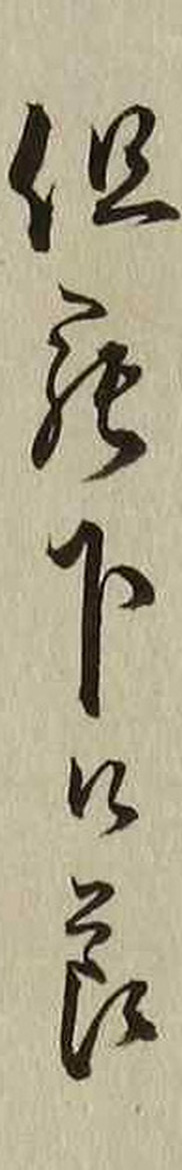但罷下候節
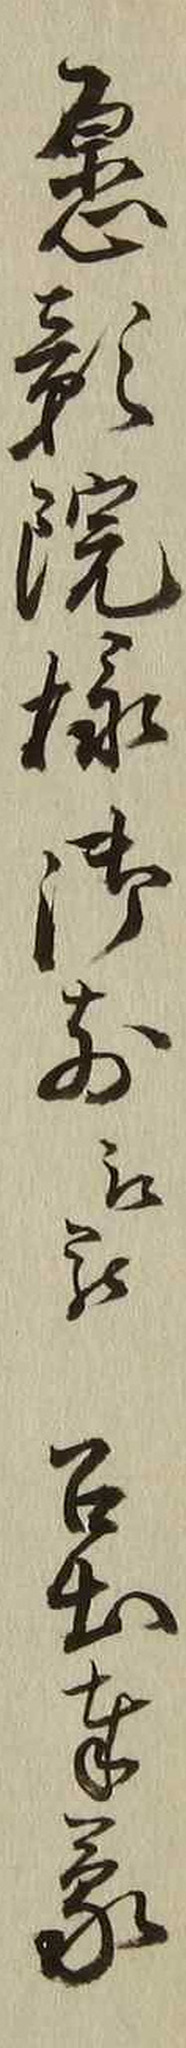愿彰院様御前江被召出奉蒙
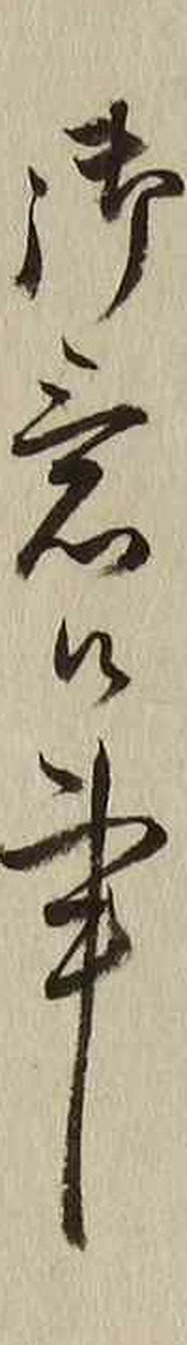御意候事
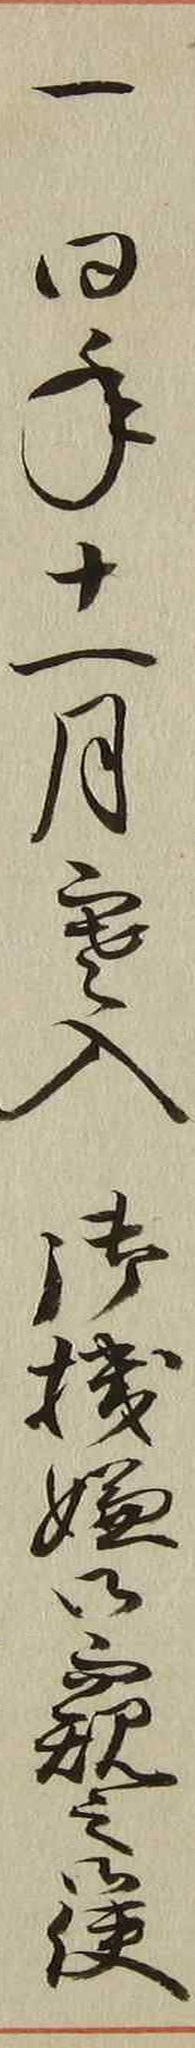一同年十一月寒入御機嫌御窺之御使
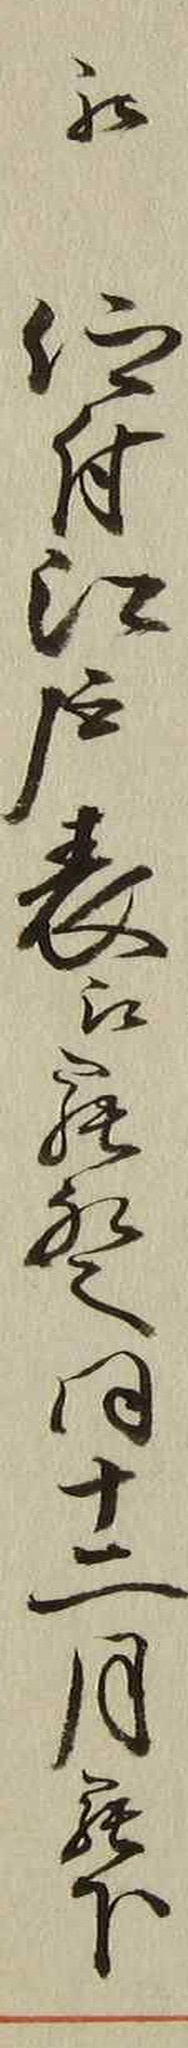被仰付江戸表江罷登同十二月罷下
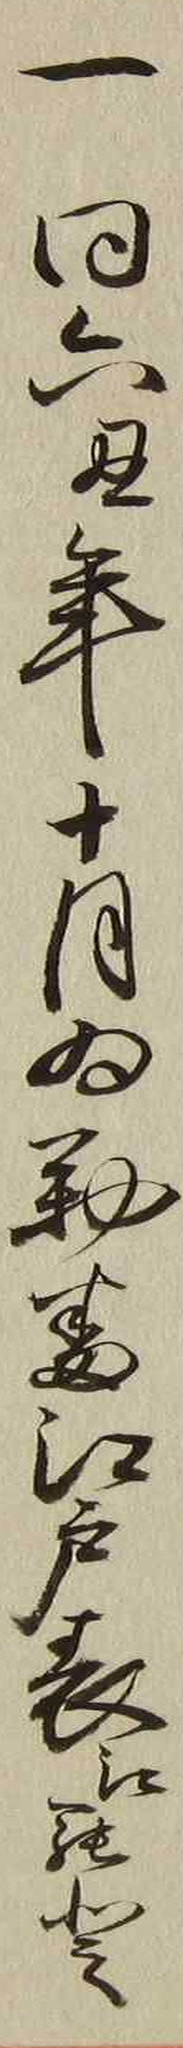一同六丑年十月為勤番江戸表江罷登
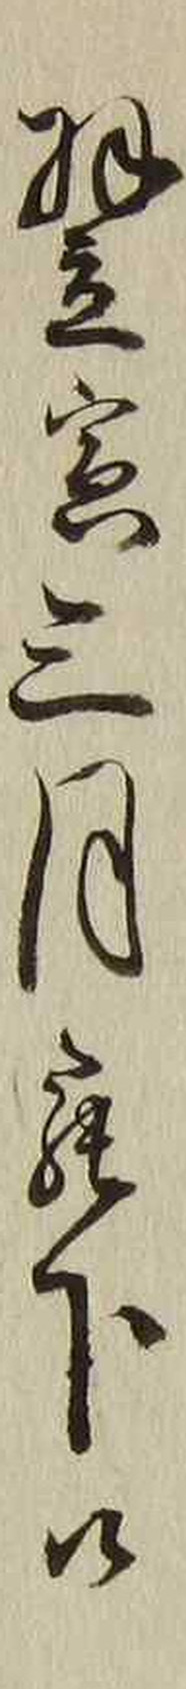翌寅三月罷下候
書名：諸士系譜　巻之60　と之部3
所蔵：会津若松市立会津図書館
